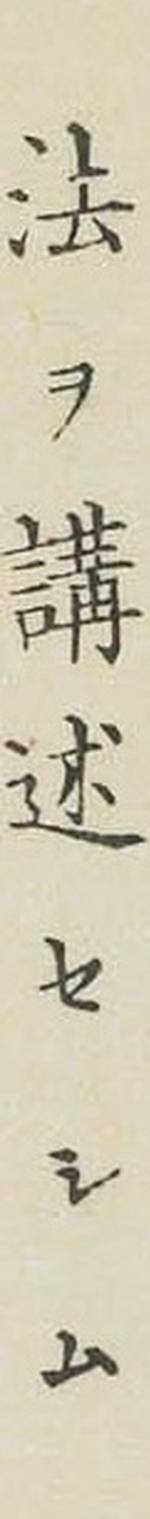法ヲ講述セシム
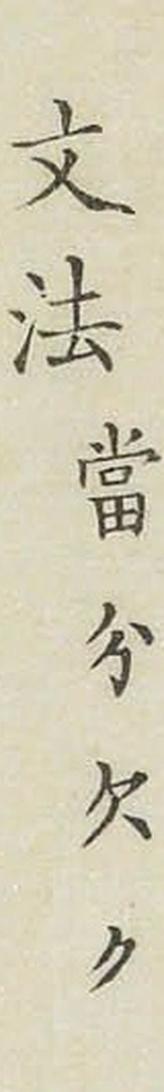文法当分欠ク
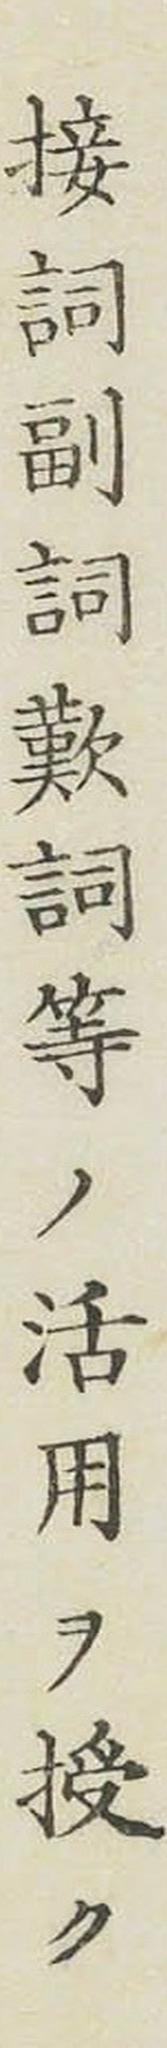接詞副詞歎詞等ノ活用ヲ授ク
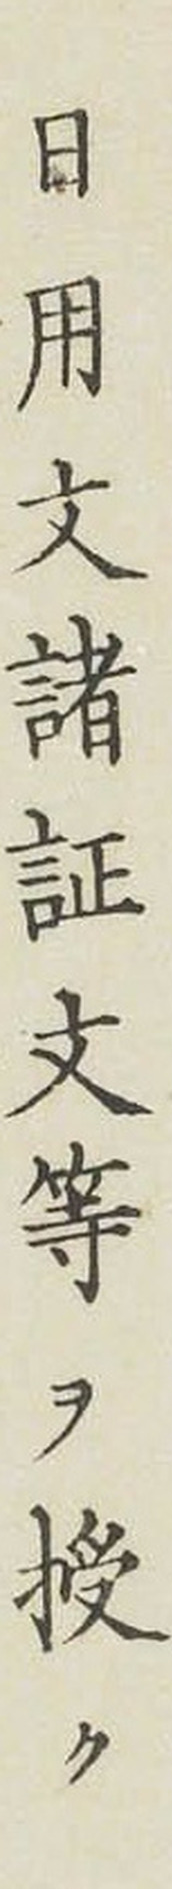日用文諸証文等ヲ授ク
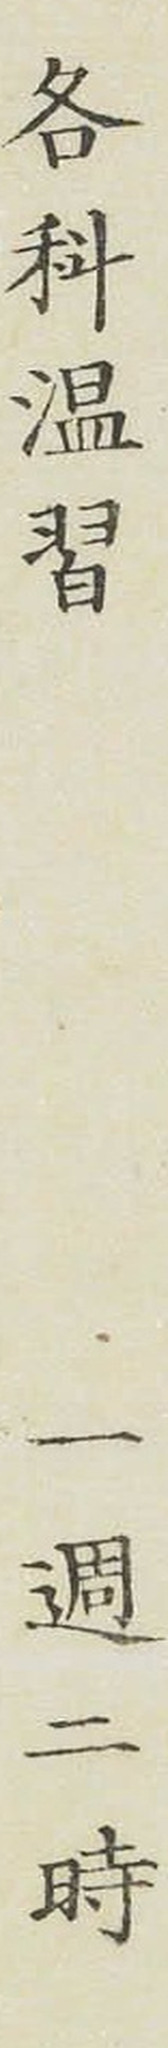各科温習一週二時
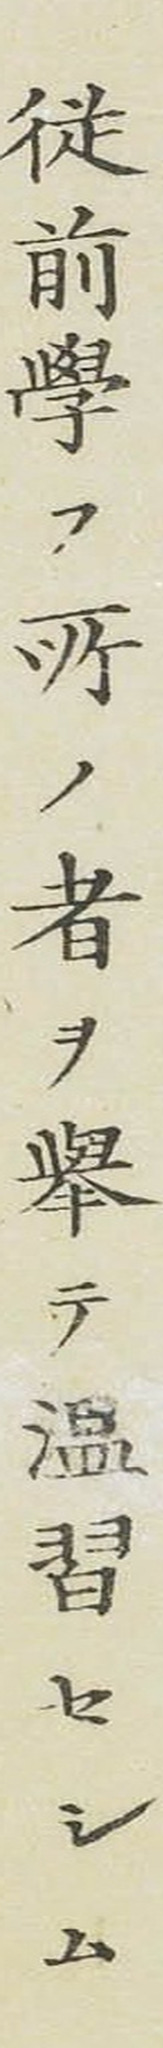従前学フ所ノ者ヲ挙テ温習セシム
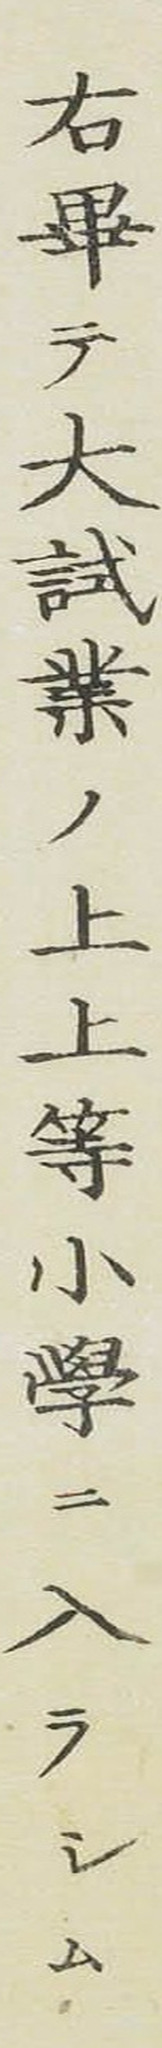右畢テ大試業ノ上上等小学ニ入ラシム
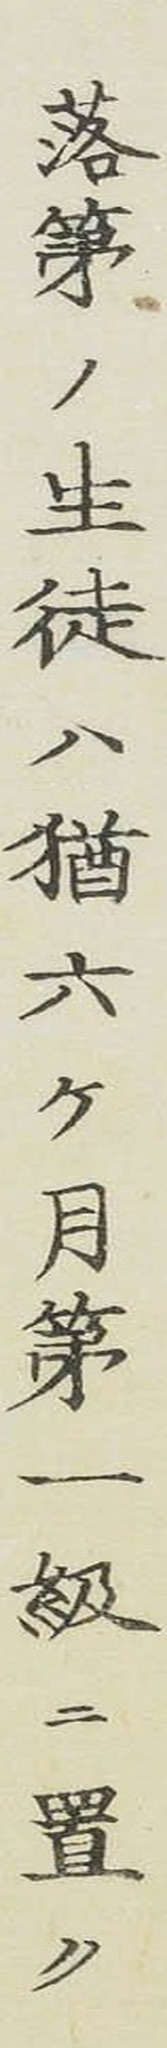落第ノ生徒ハ猶六ケ月第一級ニ置ク
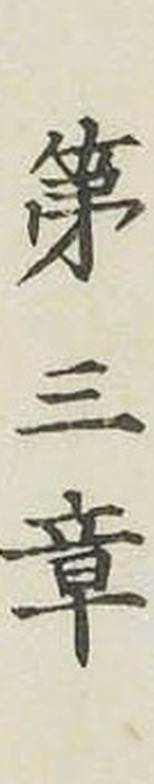第三章
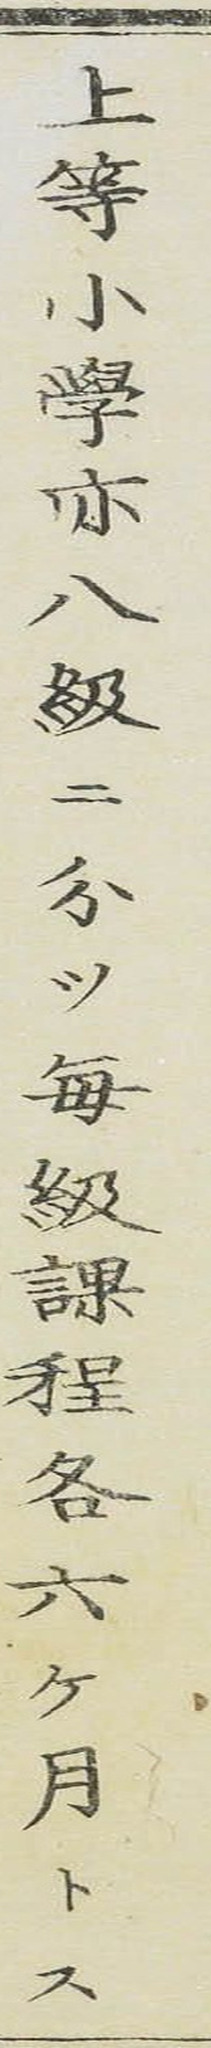上等小学校亦八級ニ分ツ毎級課程各六ケ月トス
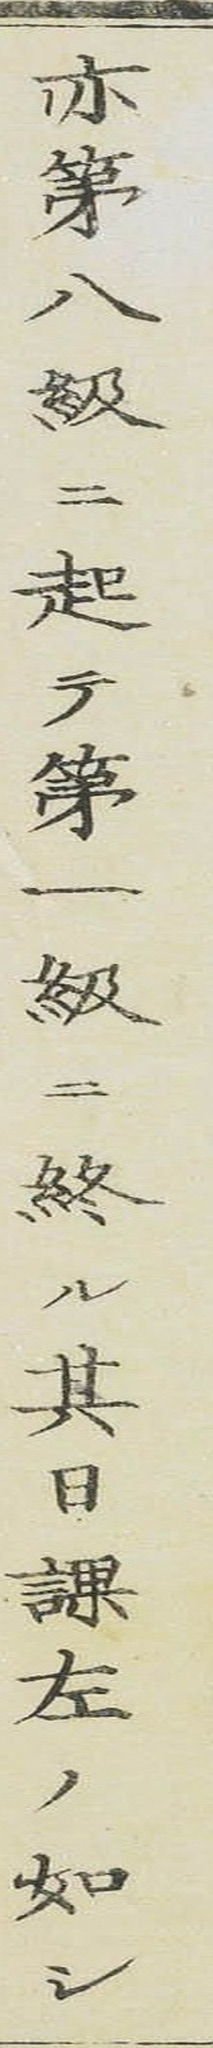亦第八級ニ起テ第一級ニ終ル其日課左ノ如シ
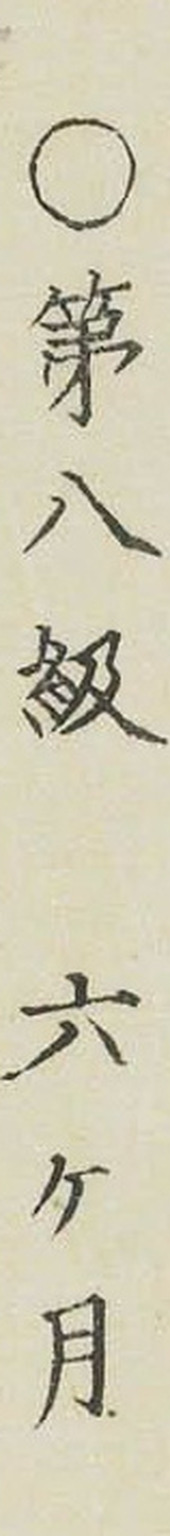○第八級六ケ月
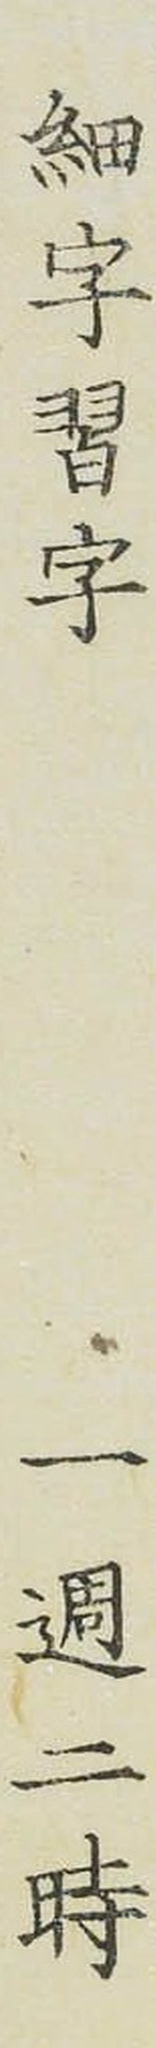細字習字一週二時
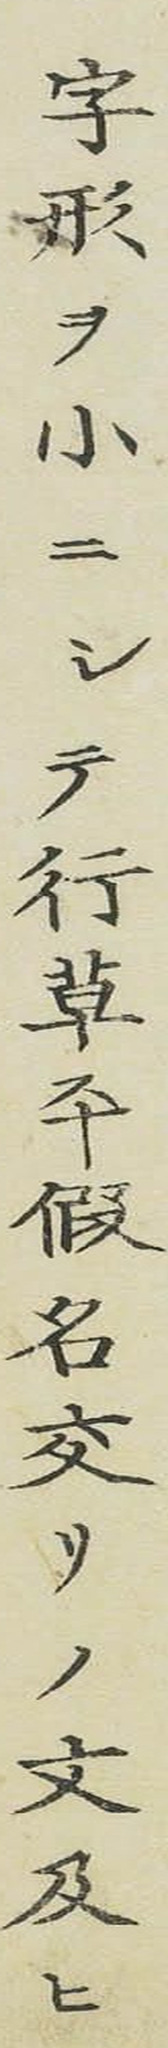字形ヲ小ニシテ行草平仮名交リノ文及ヒ
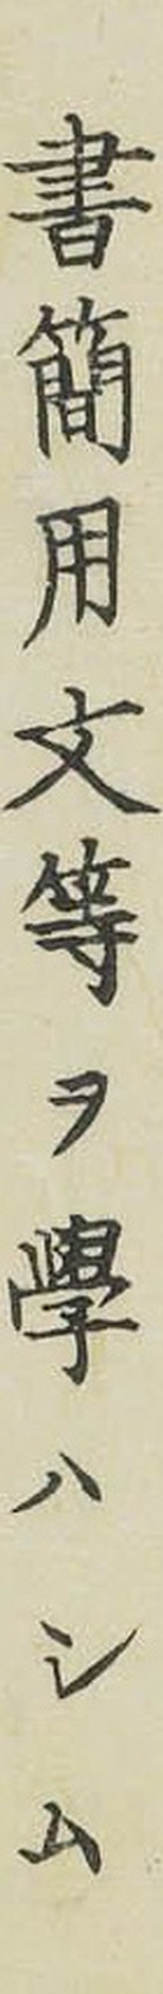書簡用文等ヲ学ハシム

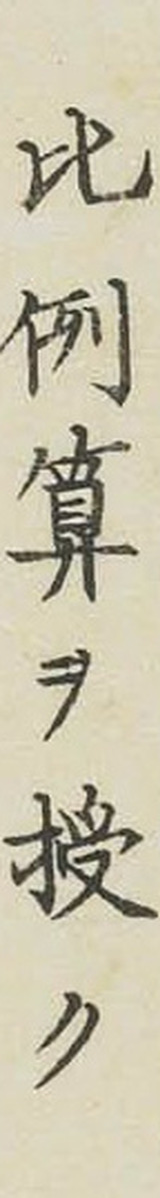比例算ヲ授ク
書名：小学教則
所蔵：東京学芸大学教育コンテンツアーカイブ
